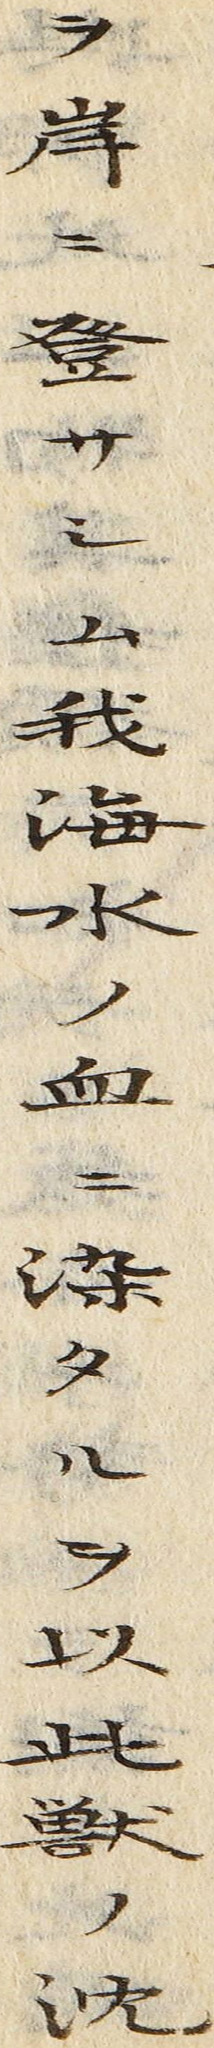ヲ岸ニ登サシム我海水ノ血ニ染タルヲ以此獣ノ沈
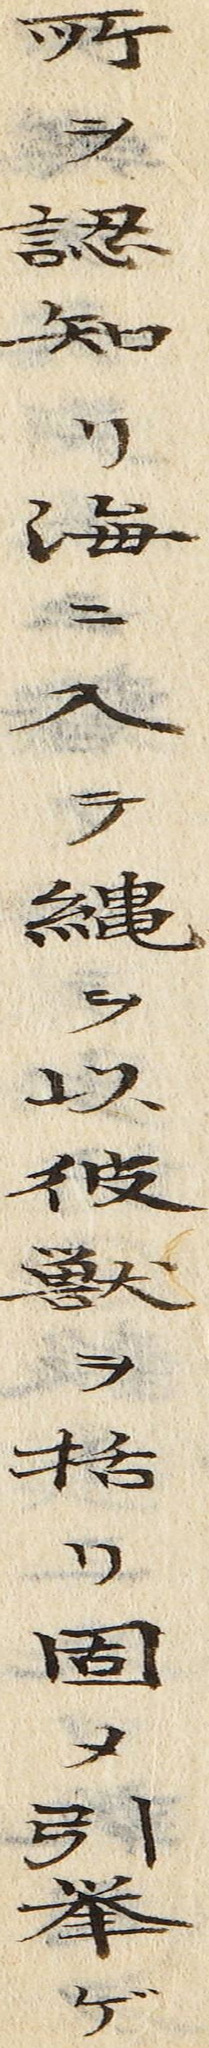所ヲ認知リ海ニ入テ縄ヲ以彼獣ヲ括リ固メ引挙ゲ
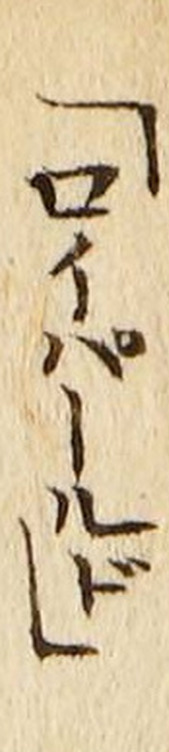「ロイパールド」
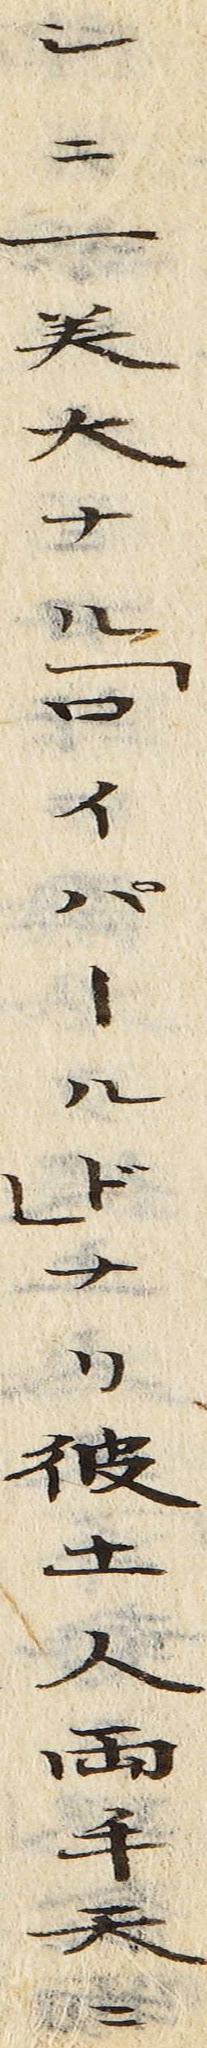シニ一美大ナル「ロイパールド」ナリ彼土人両手天ニ
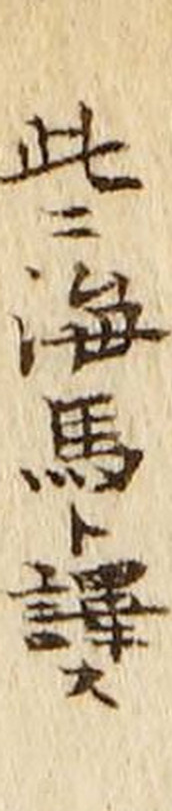此ニ海馬ト訳ス
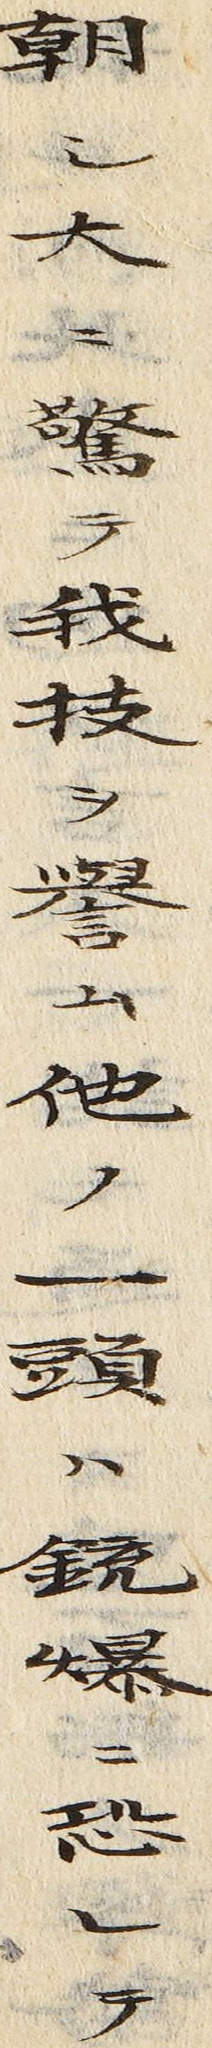朝シ大ニ驚テ我技ヲ誉ム他ノ一頭ハ銃爆ニ恐レテ
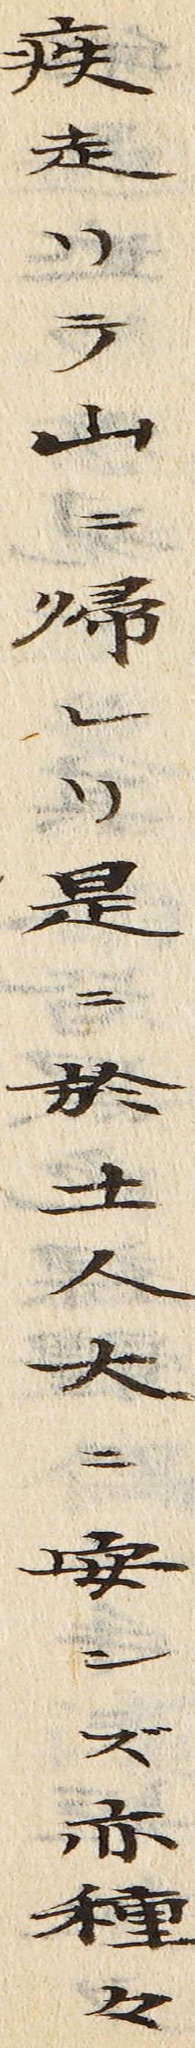疾走リテ山ニ帰レリ是ニ於土人大ニ安ンズ亦種々
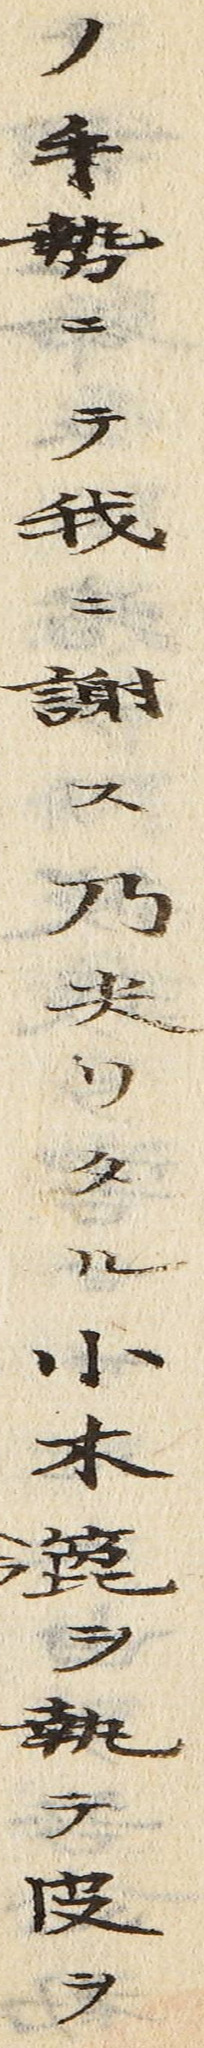ノ手勢ニテ我ニ謝ス乃尖リタル小木箆執テ皮ヲ
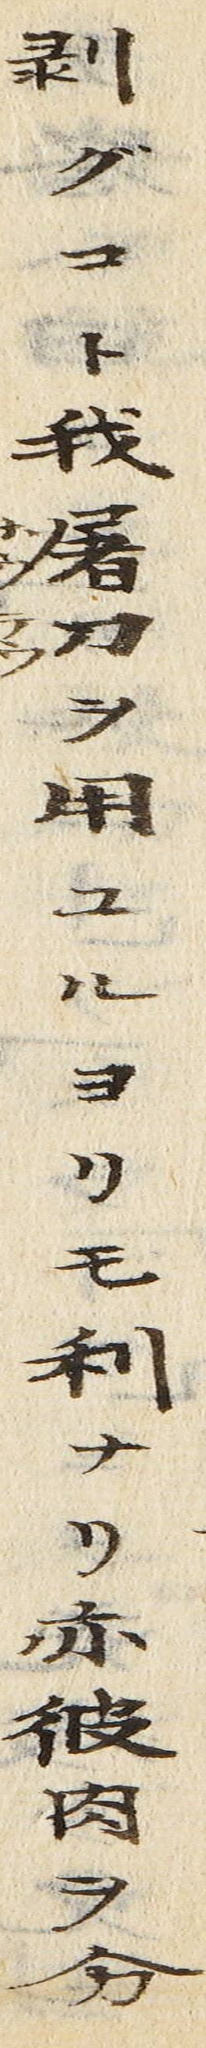剥グコト我屠刀ヲ用ユルヨリモ利ナリ亦彼肉ヲ分
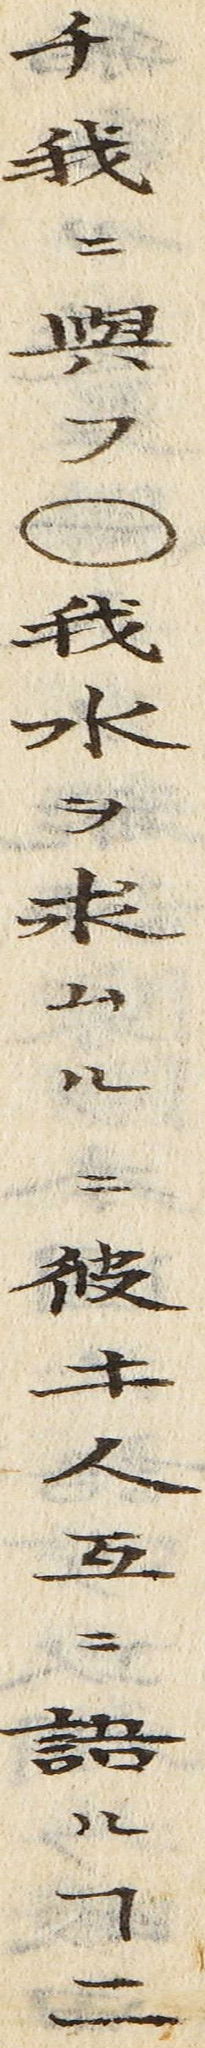チ我ニ与フ◯我水ヲ求ムルニ彼土人互ニ語ルコト二
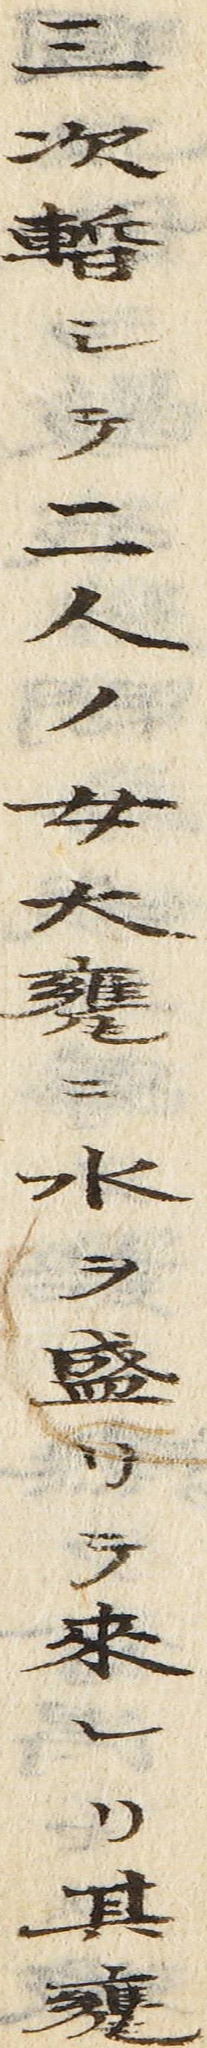三次暫シテ二人ノ女大甕ニ水ヲ盛リテ来レリ其甕
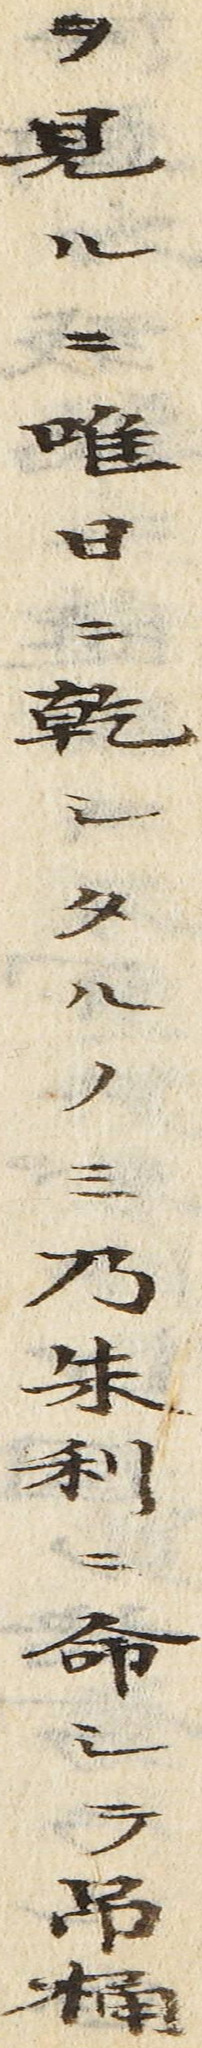ヲ見ルニ唯日ニ乾シタルノミ乃朱利ニ命シテ吊桶
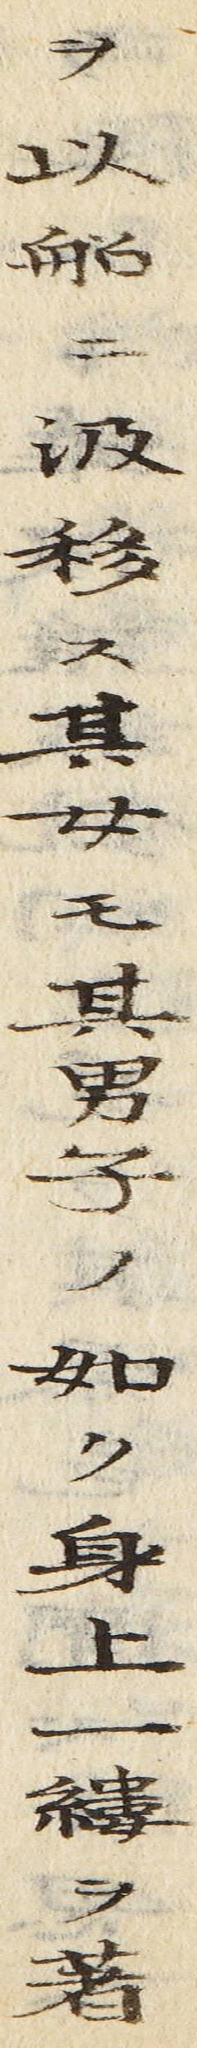ヲ以船ニ汲移ス其女モ其男子ノ如ク身上一縷ヲ著
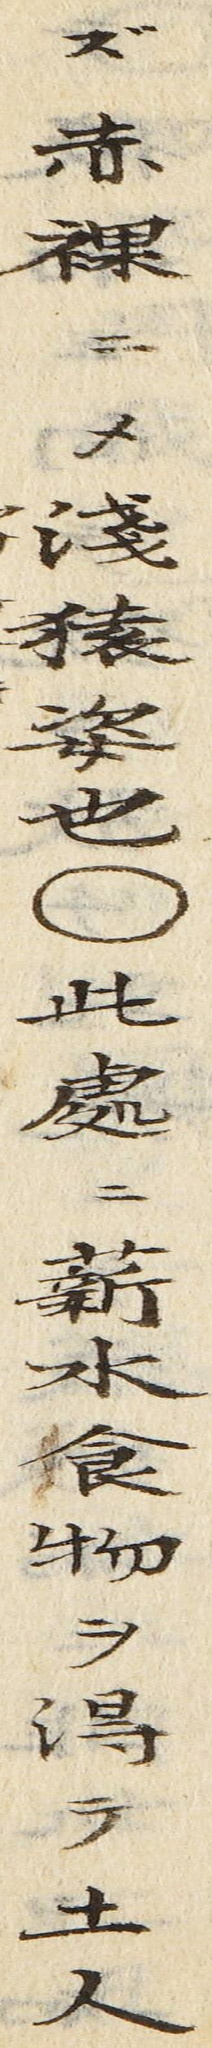ズ赤裸にシテ淺猿姿也◯此処ニ薪水食物ヲ得テ土人
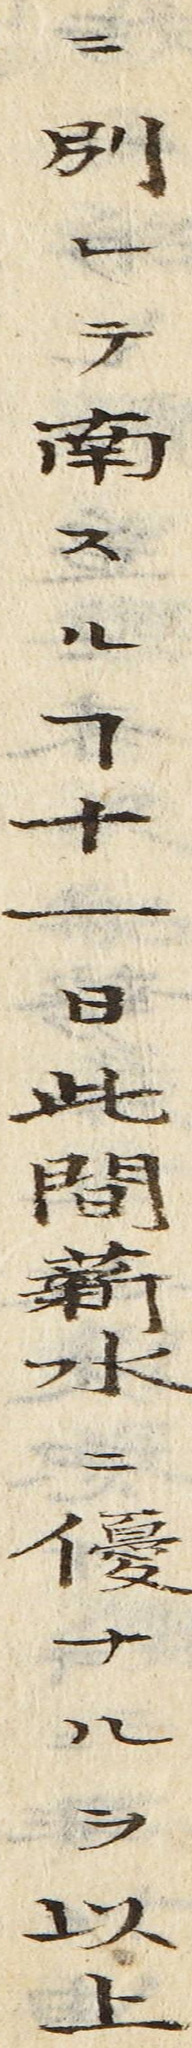ニ別レテ南スルコト十一日此間薪水ニ優ナルヲ以上
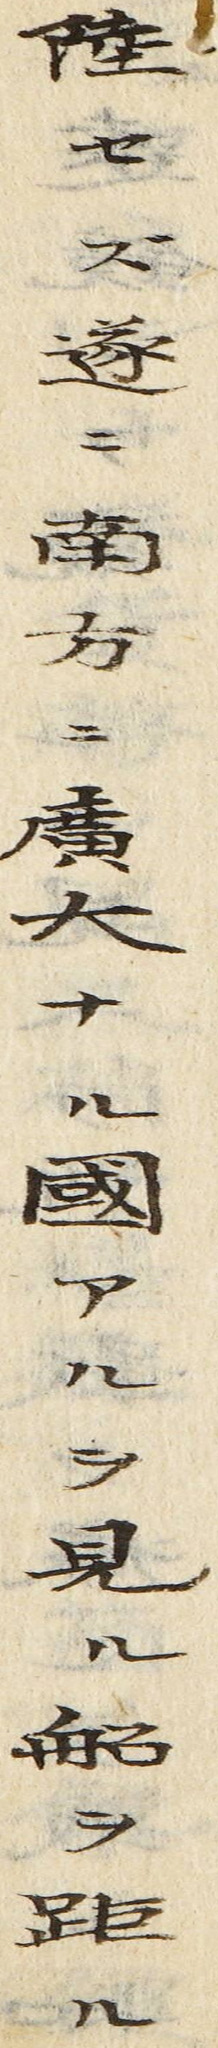陸セズ遂ニ南方ニ広大ナル国アルヲ見ル船ヲ距ル
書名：漂流紀事
